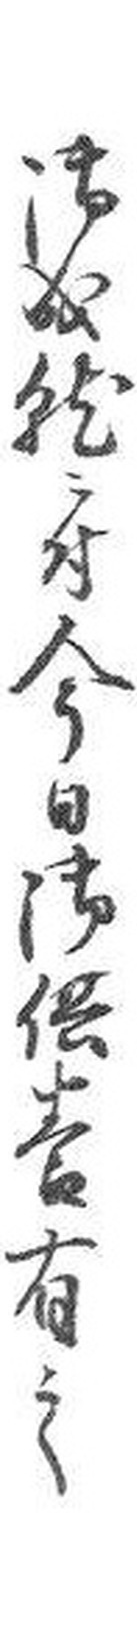御成就ニ付今日御供養有之
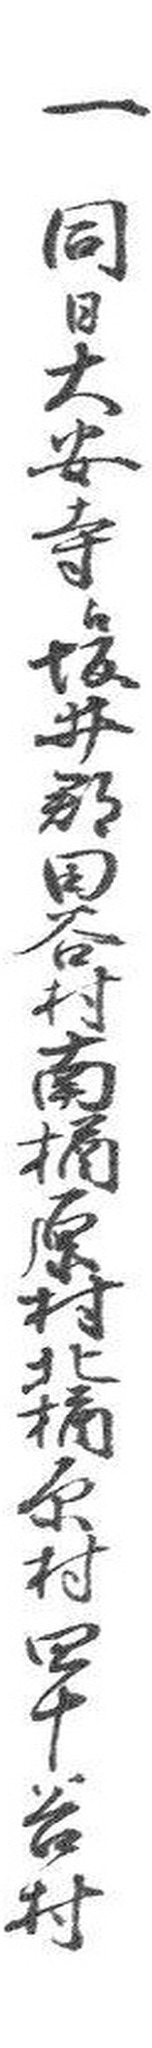一同日大安寺江坂井郡田谷村南楢原村北楢原村四十谷村
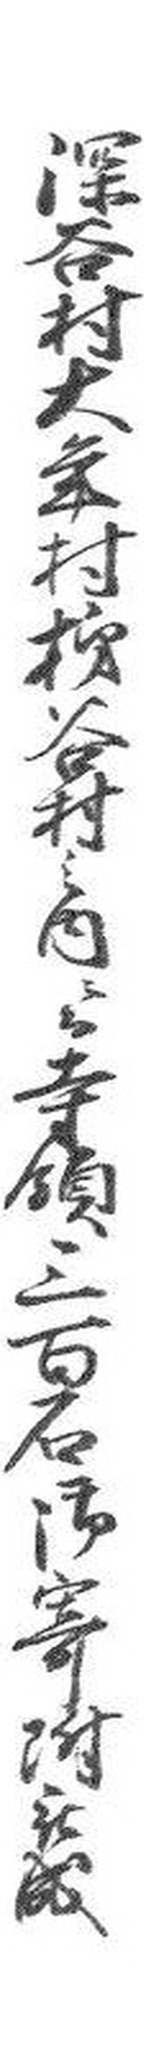深谷村大年村柿谷村之内ニ而寺領三百石御寄附被成
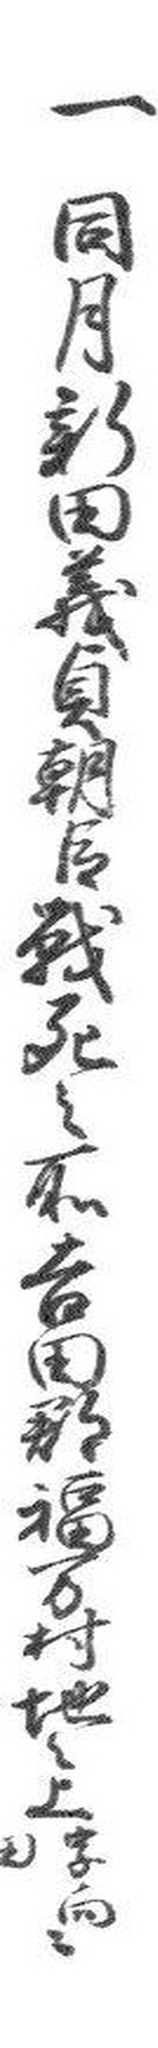一同月新田義貞朝臣戦死之所吉田郡福万村地之上字向田ニ
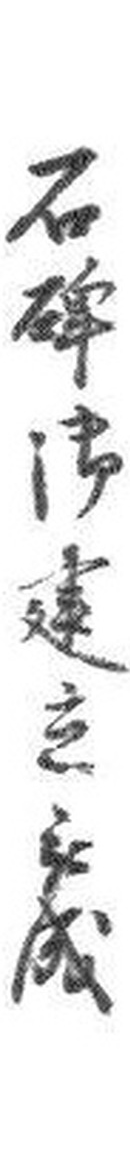石碑御建立被成
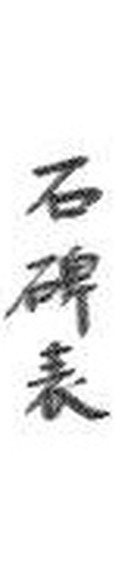石碑表
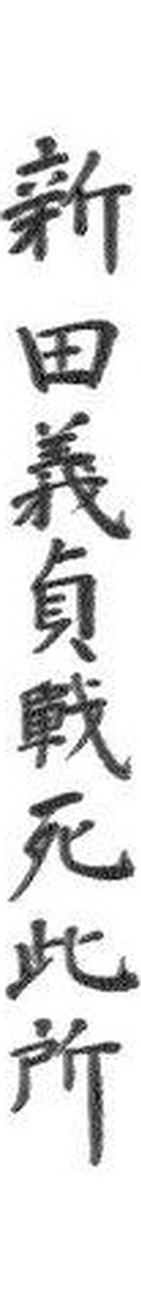新田義貞戦死此所
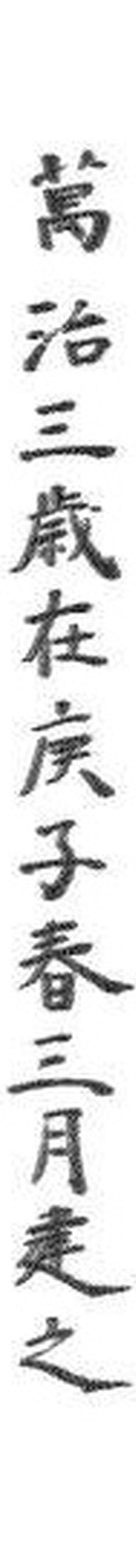万治三歳在庚子春三月建之
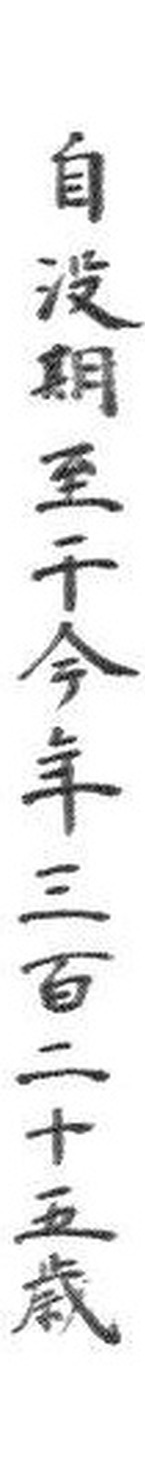自没期至于今年三百二十五歳
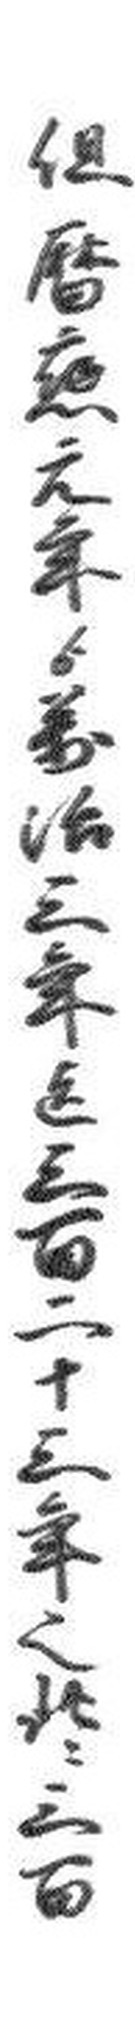但暦応元年ゟ万治三年迄三百二十三年也此ニ三百
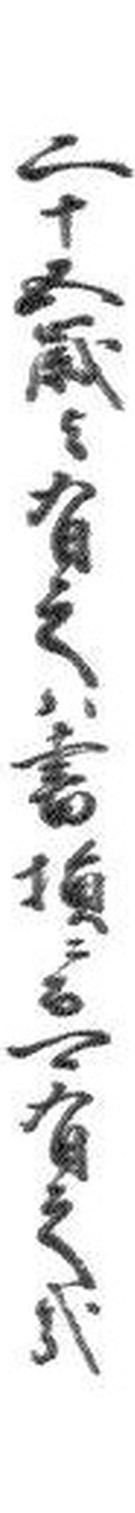二十五歳と有之ハ書損ニ而可有之哉

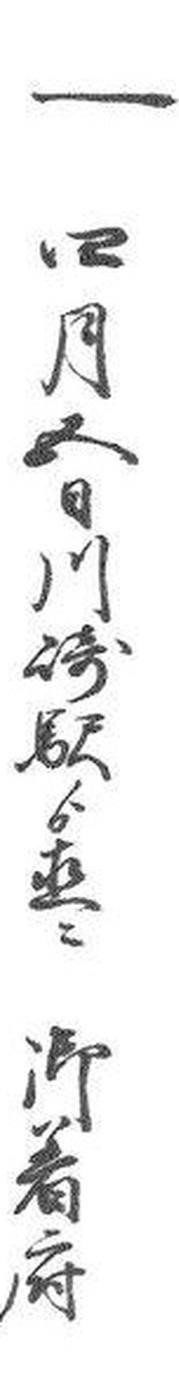一四月五日川崎駅ゟ直ニ御着府
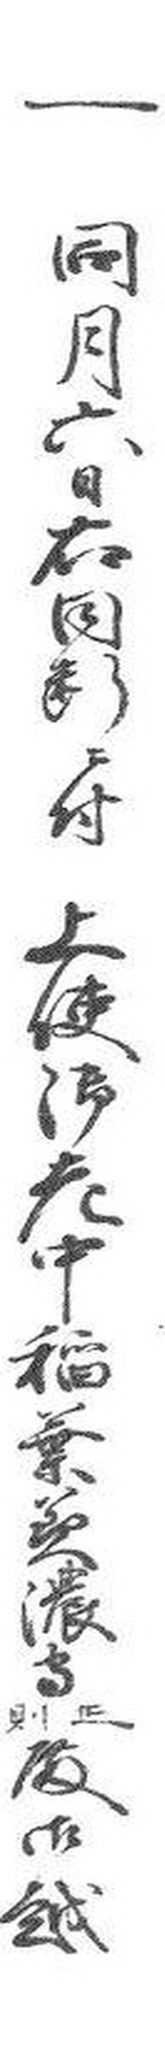一同月六日右同断ニ付上使御老中稲葉美濃守正則殿御越
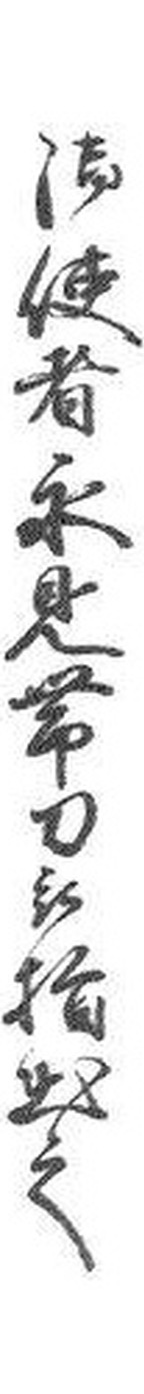御使者永見帯刀被指出之
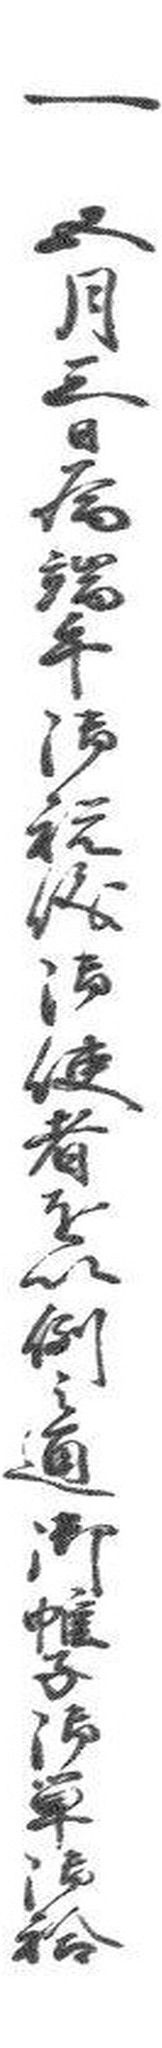一五月三日為端午御祝儀御使者を以例之通御帷子御単御袷
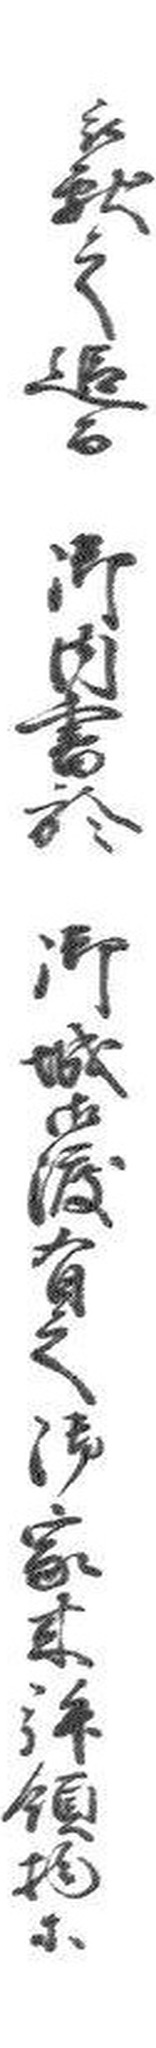被献之追而御内書於御城御渡有之御家来拝領物等
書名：家譜 六 光通公 従万治三年到寛文三年
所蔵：福井県文書館 Fukui Prefectural Archives
